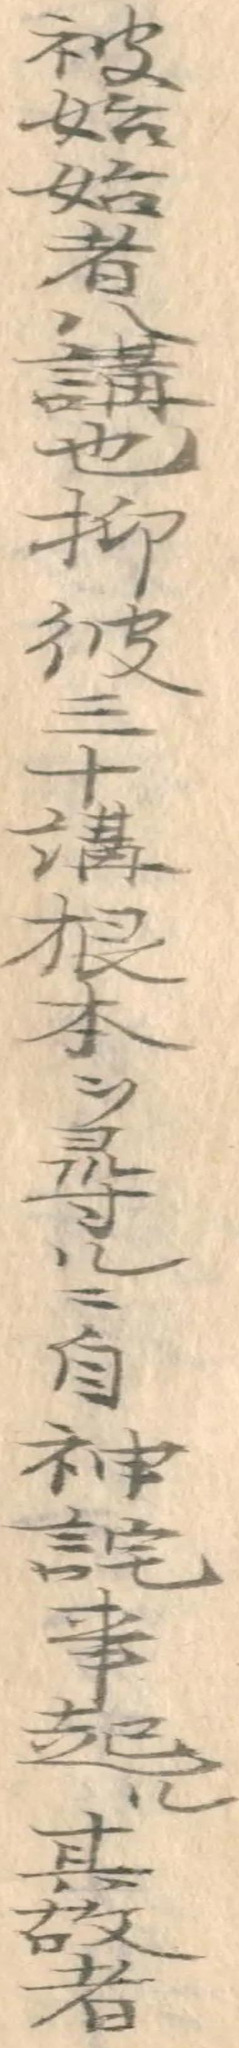被始始者八講也抑彼三十講根本ヲ尋ルニ自神詫事起ル其故者
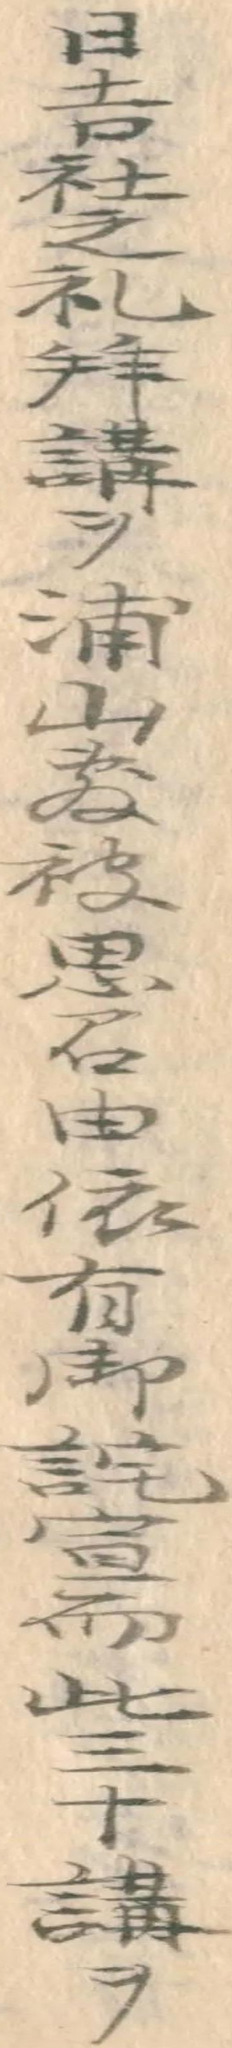日吉社之礼拝講ヲ浦山敷被思召由依有御詫宣而此三十講ヲ
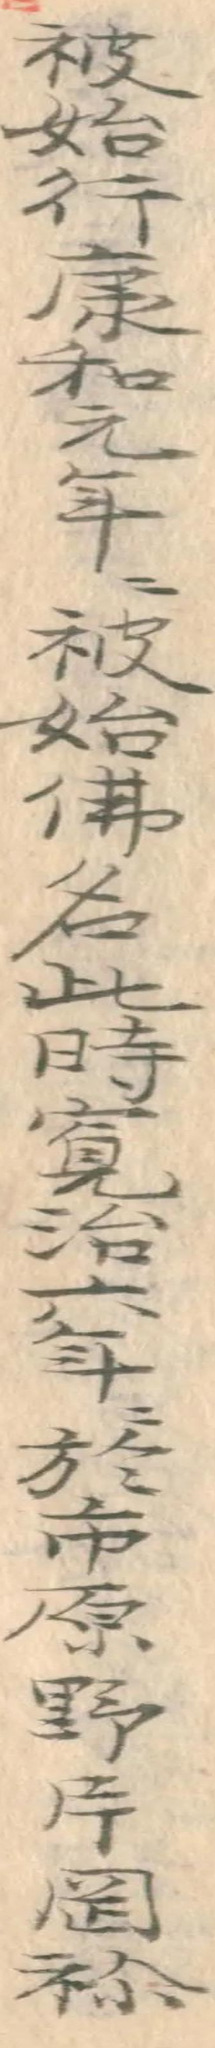被始行康和元年ニ被始仏名此時寛治六年ニ於市原野片岡祢
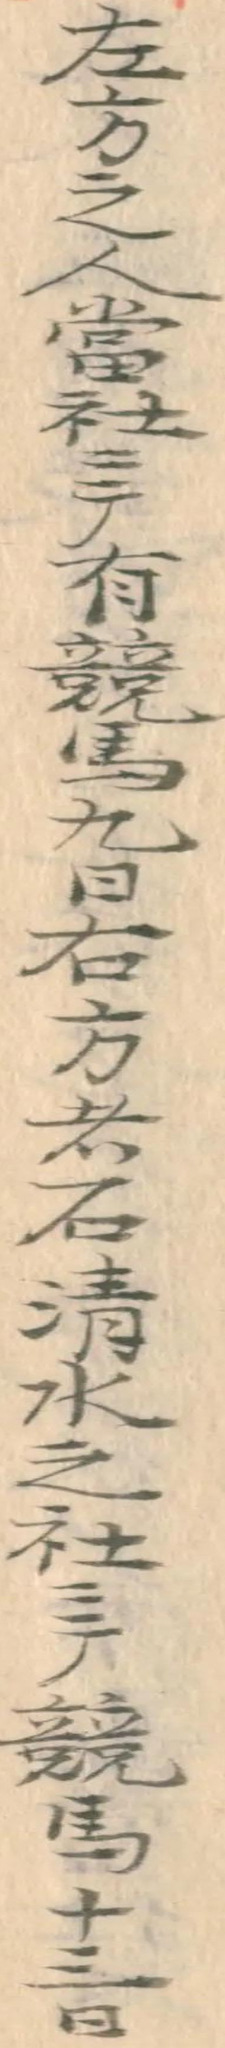左方之人当社ニテ有競馬九日右方者石清水之社ニテ競馬十三日
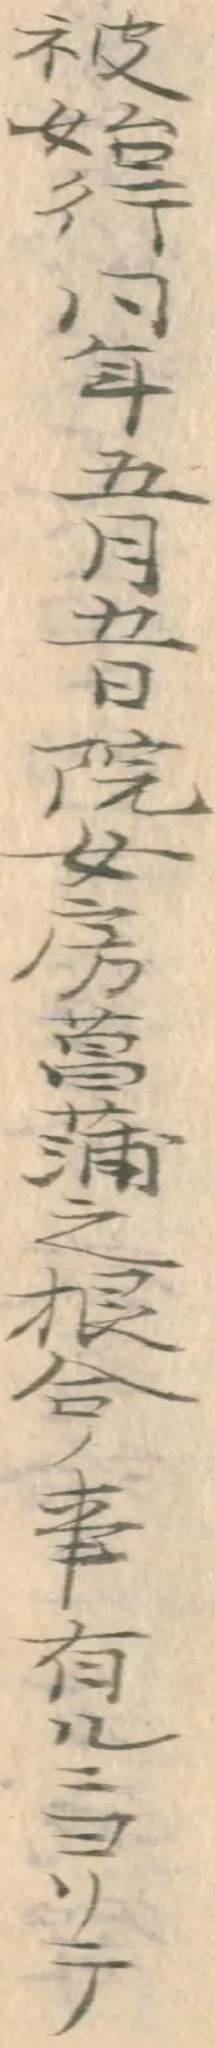被始行同年五月五日院女房菖蒲之根合ノ事有ルニヨリテ
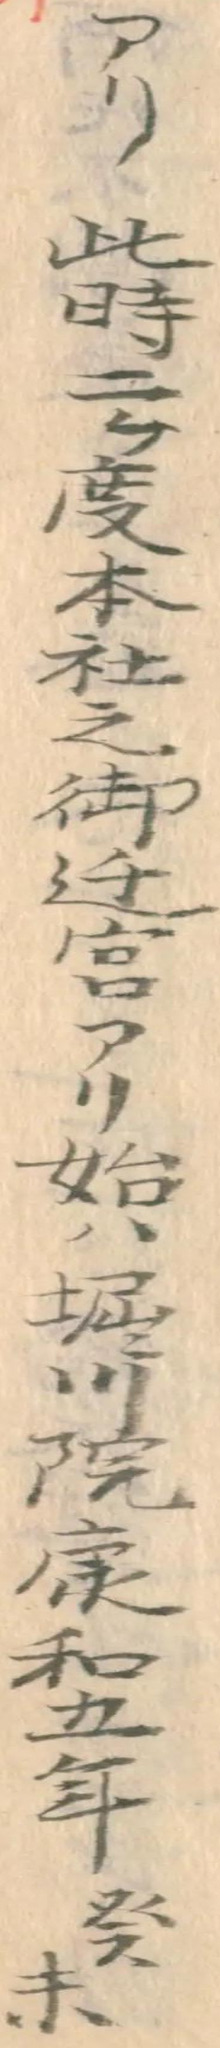アリ此時二ケ度本社之御遷宮アリ始ハ堀川院康和五年癸未
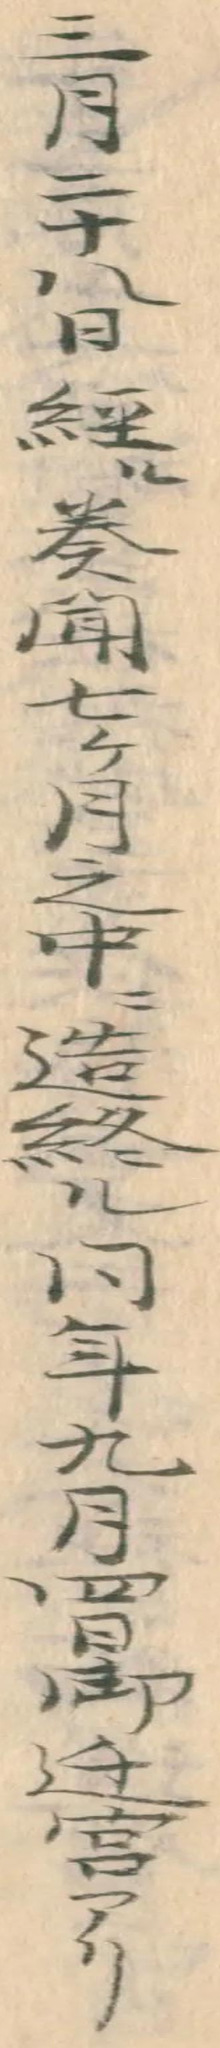三月二十八日経ル奏聞七ケ月之中ニ造終ル同年九月四日御遷宮アリ
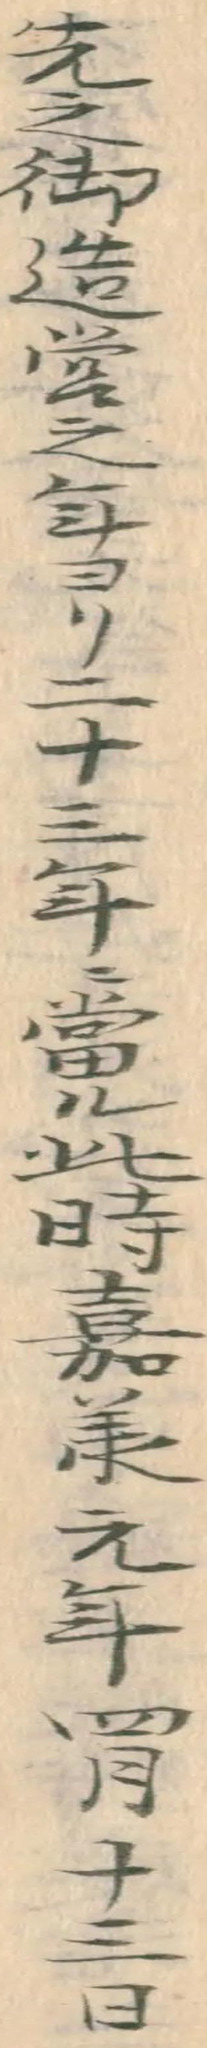先之御造営之年ヨリ二十三年ニ当ル此時嘉承元年四月十三日
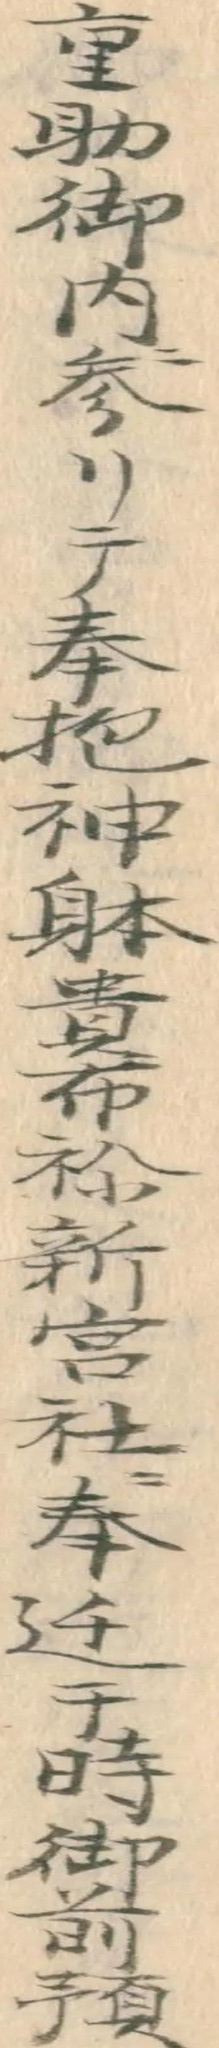重助御内ニ参リテ奉抱神躰貴布祢新宮社ニ奉遷于時御前預
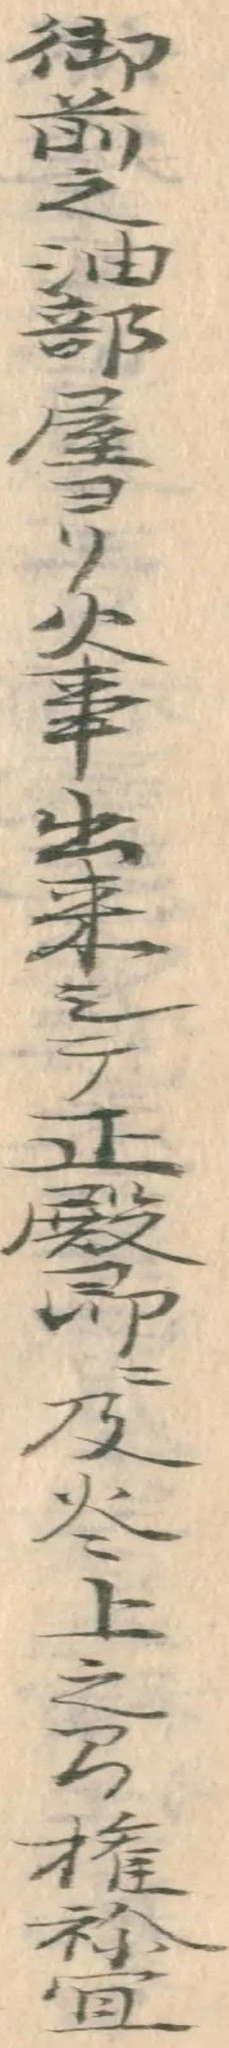御前之油部屋ヨリ火事出来シテ正殿即ニ及炎上之間権祢宜
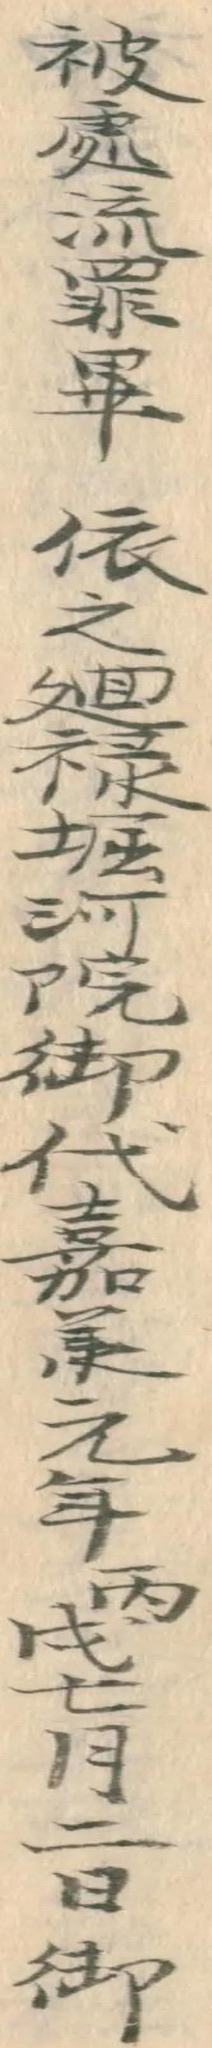被処流罪畢依之廻禄堀河院御代嘉承元年丙戌七月二日御
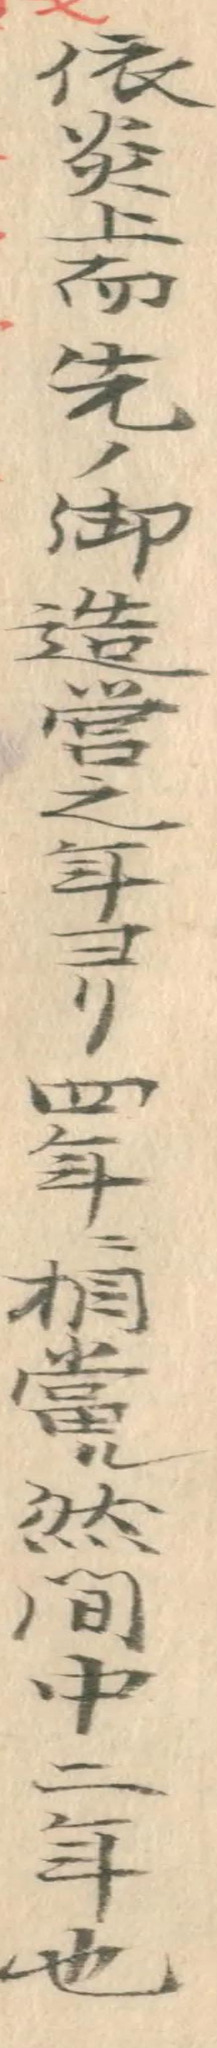依炎上而先ノ御造営之年ヨリ四年ニ相当ル然間中二年也
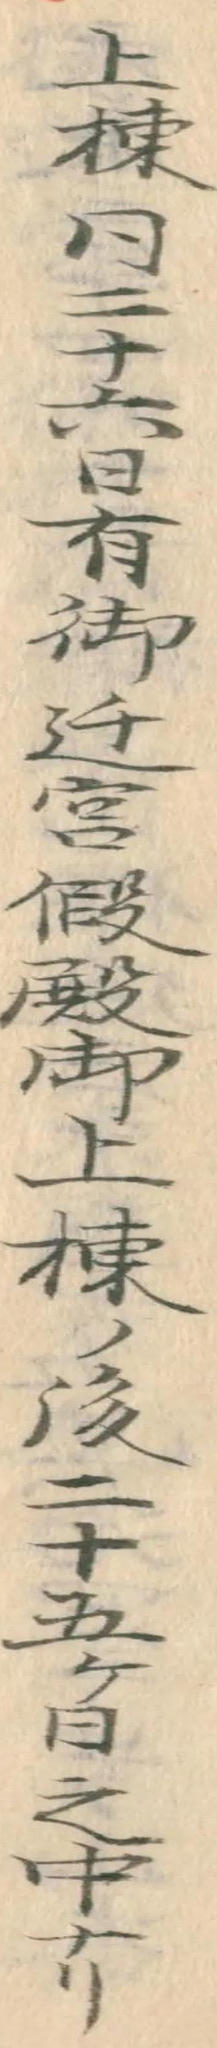上棟同二十六日有御遷宮仮殿御上棟ノ後二十五ケ日之中ナリ
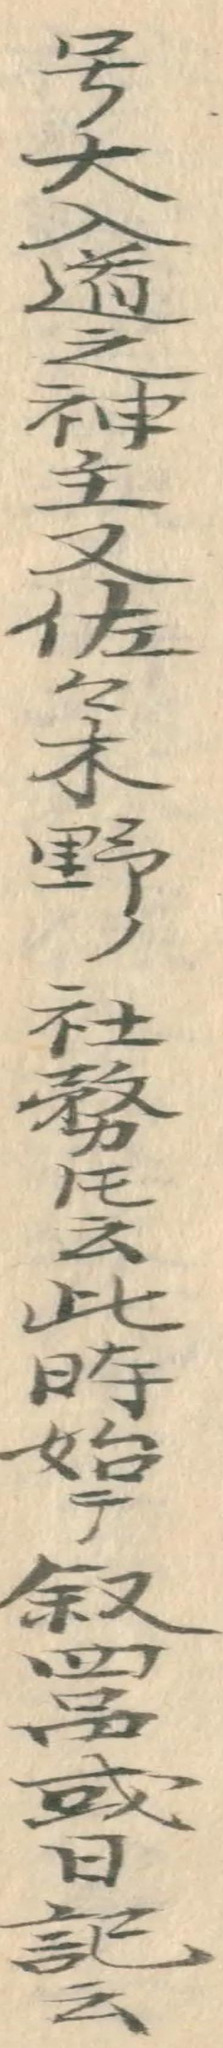号大入道之神主又佐々木野ノ社務トモ云此時始テ叙四品或日記云
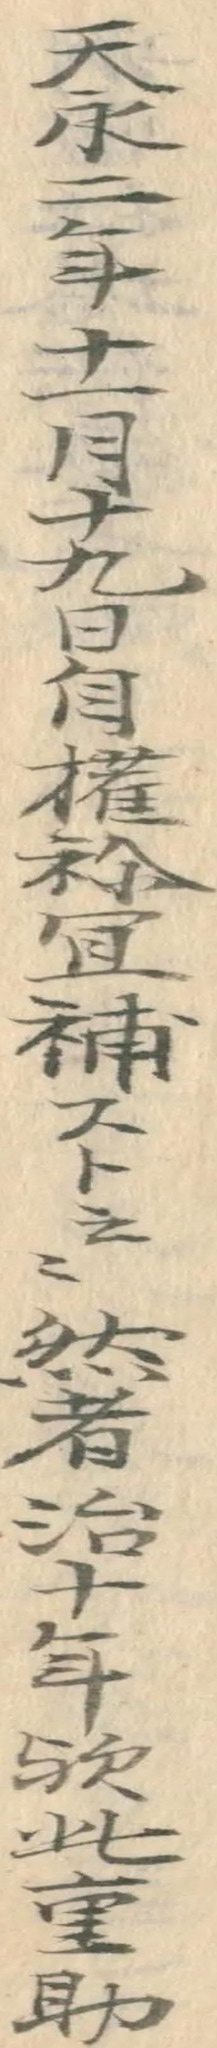天永二年十一月十九日自権祢宜補スト云々然者治十年歟此重助
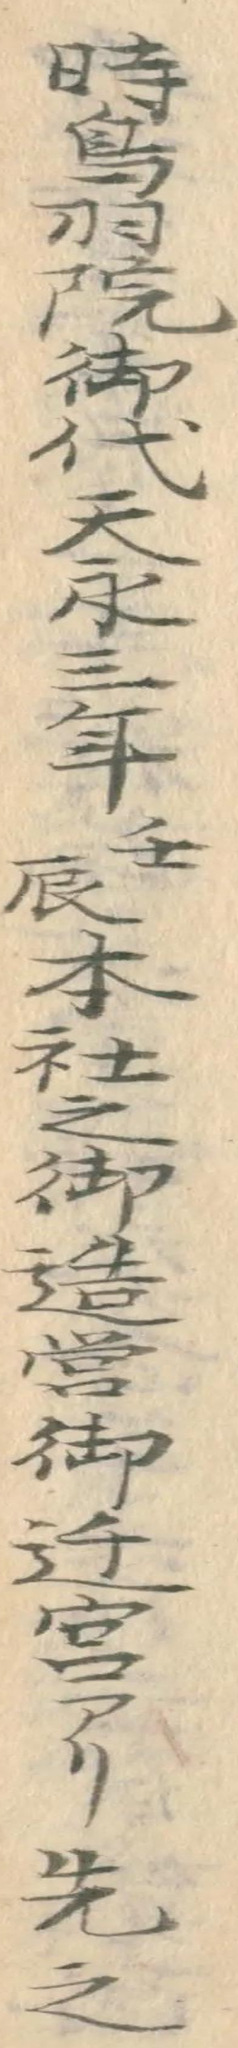時鳥羽院御代天永三年壬辰本社之御造営御遷宮アリ先之
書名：賀茂社記録. 第24冊
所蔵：国立国会図書館 National Diet Library, JAPAN
